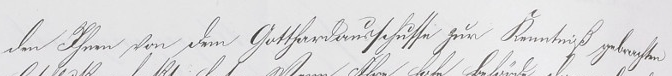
den Ihnen von dem Gotthardausschusse zur Kenntniß gebrachten
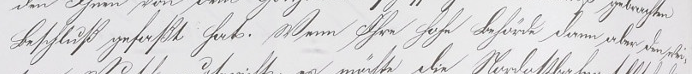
Beschluß gefaßt hat. Wenn Ihre hohe Behörde dann aber den wei-
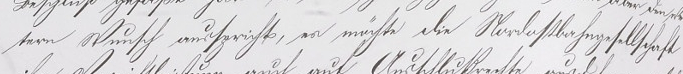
tern Wunsch ausspricht, es möchte die Nordostbahngesellschaft
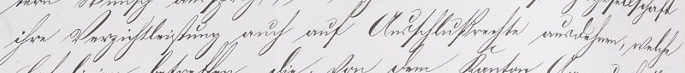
ihre Verzichtleistung auch auf Ausschlußrechte ausdehnen, welche
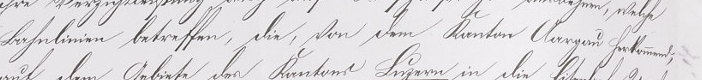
Bahnlinien betreffen, die, von dem Kanton Aargau herkommend,
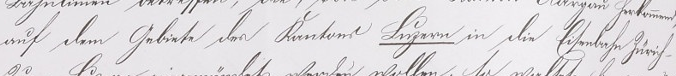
auf dem Gebiete des Kantons Luzern in die Eisenbahn Zürich–
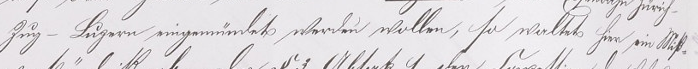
Zug–Luzern eingemündet werden wollen, so waltet hier ein Miß-
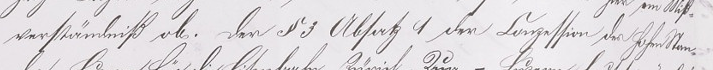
verständniß ob. Der § 3 Absatz 1 der Conzession des hohen Stan-
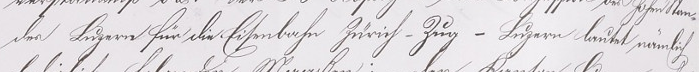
des Luzern für die Eisenbahn Zürich–Zug–Luzern lautet nämlich
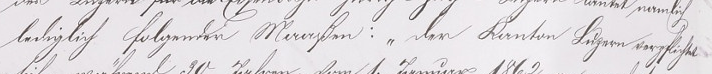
lediglich folgender Maaßen: «Der Kanton Luzern verpflichtet
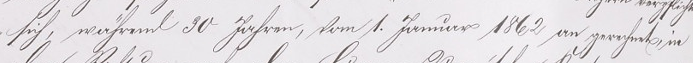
sich, während 30 Jahren, vom 1. Januar 1862 an gerechnet, in
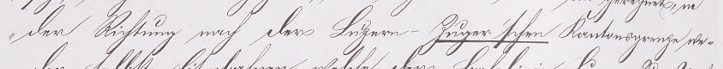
der Richtung nach der Luzern–Zuger'schen Kantonsgrenze, we-
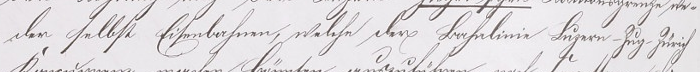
der selbst Eisenbahnen, welche der Bahnlinie Luzern–Zug–Zürich
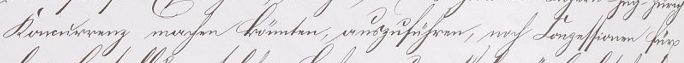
Koncurrenz machen könnten, auszuführen, noch Conzessionen für
